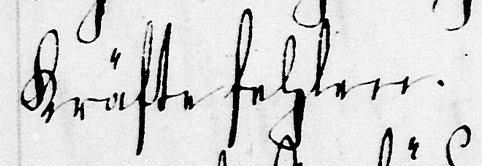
Kräfte fehlen.
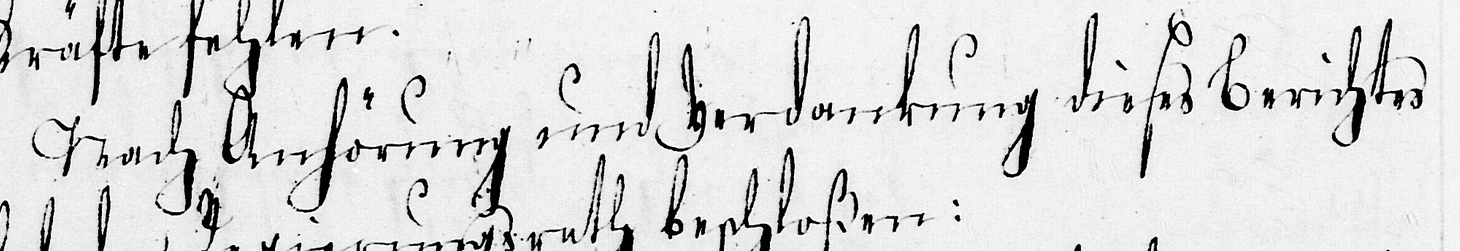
Nach Anhörung und Verdankung dieses Berichtes
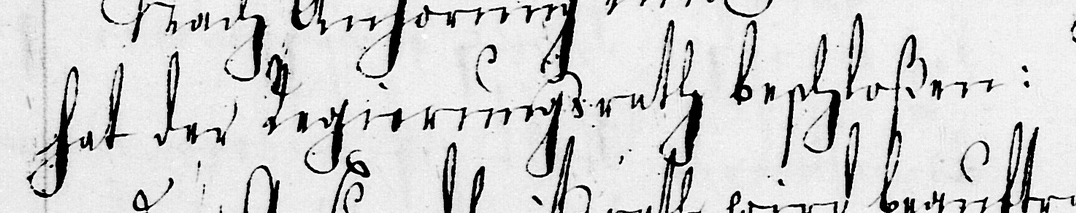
hat der Regierungsrath beschloßen:
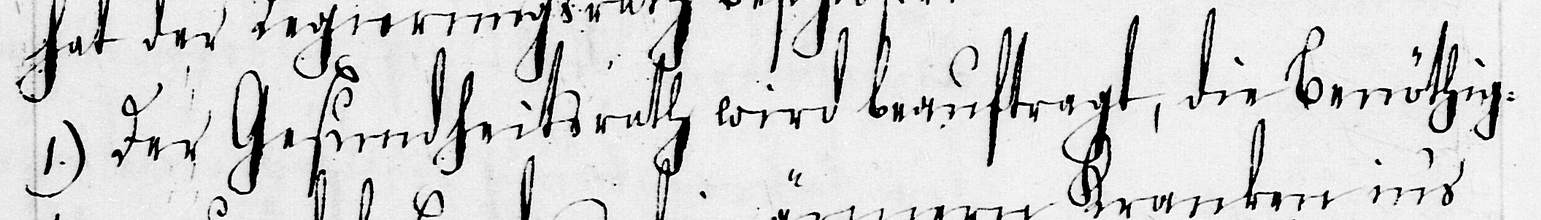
1.) Der Gesundheitsrath wird beauftragt, die Benöthig¬
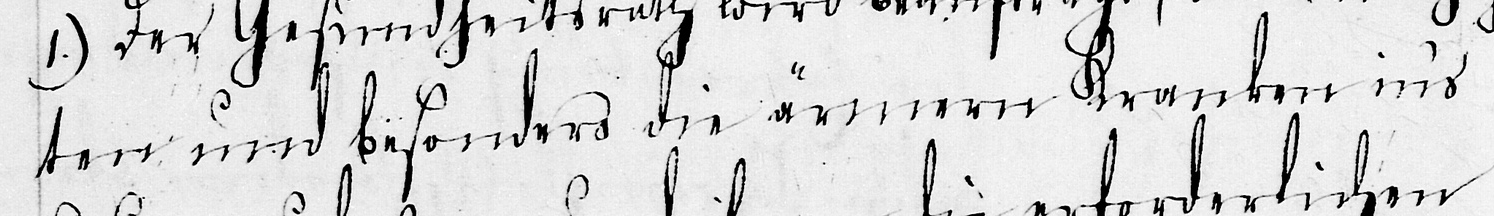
ten und besonders die ärmern Kranken in’s
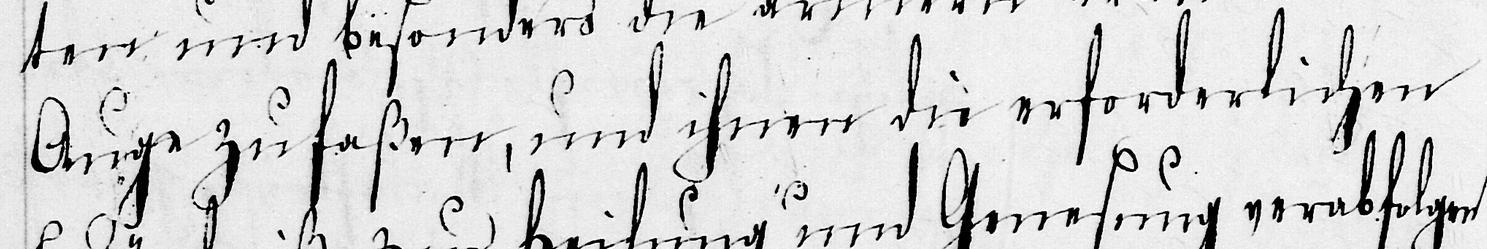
Auge zu faßen, und ihnen die erforderlichen
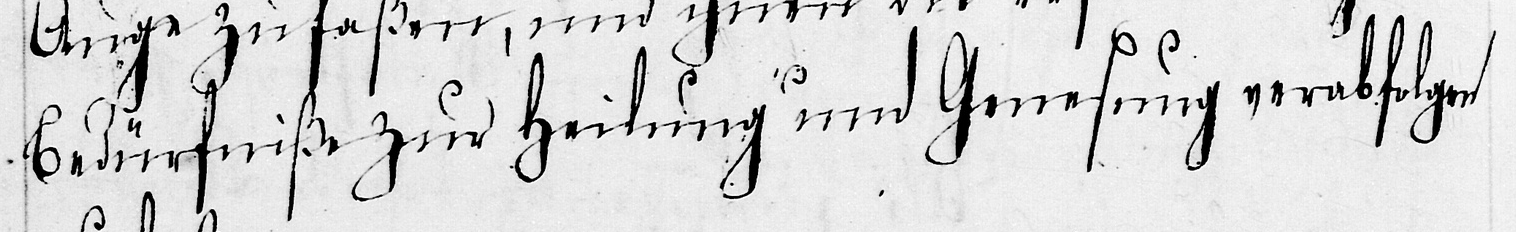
Bedürfniße zur Heilung und Genesung verabfolgen
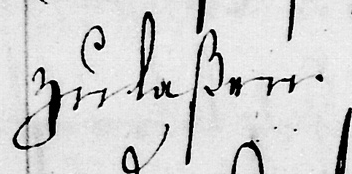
zu laßen.
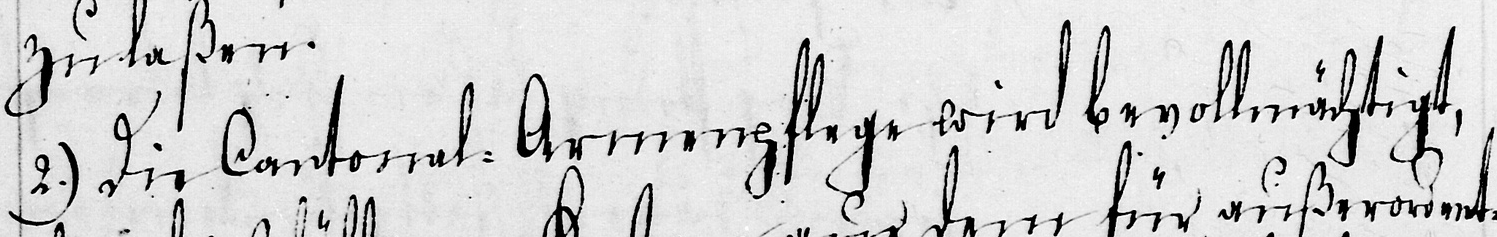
2.) Die Cantonal-Armenpflege wird bevollmächtigt,
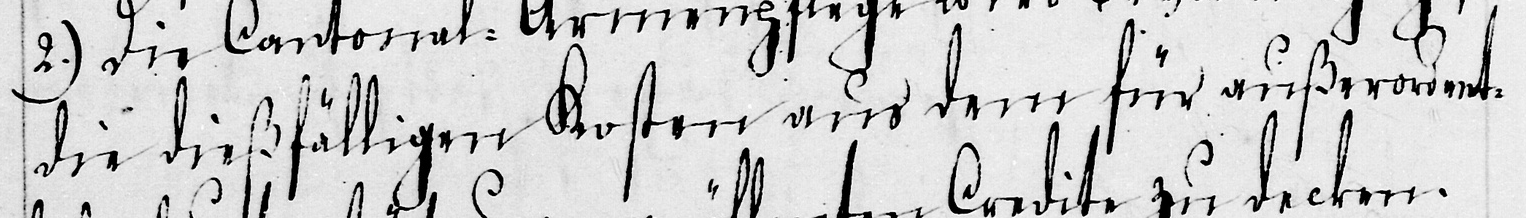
die dießfälligen Kosten aus dem für außerordent¬
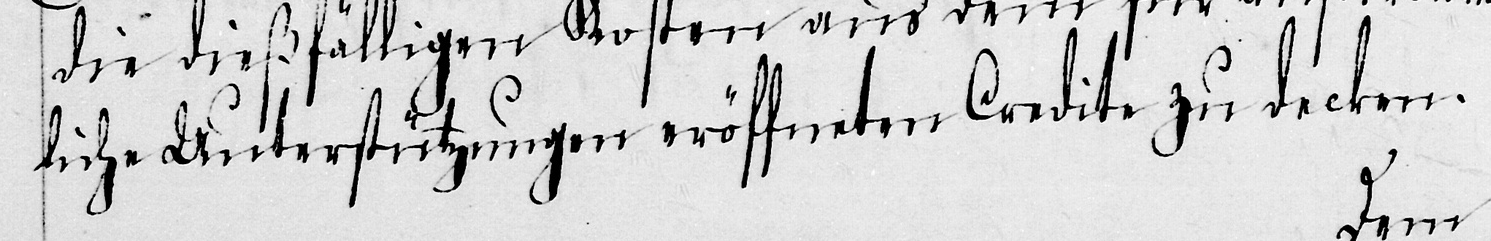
liche Unterstützungen eröffneten Credite zu decken.
